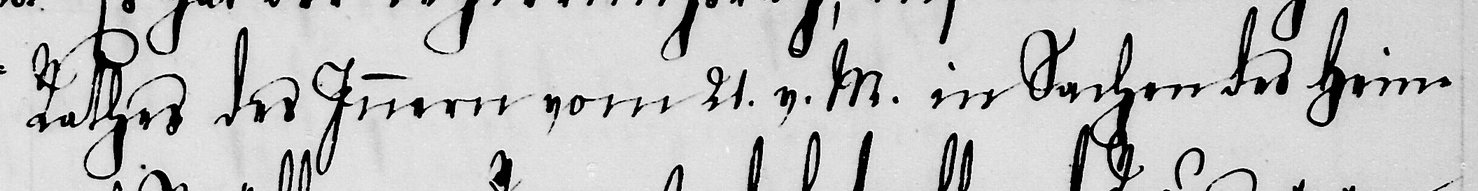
Rathes des Innern vom 21. v. M. ein Sachen des Hein¬
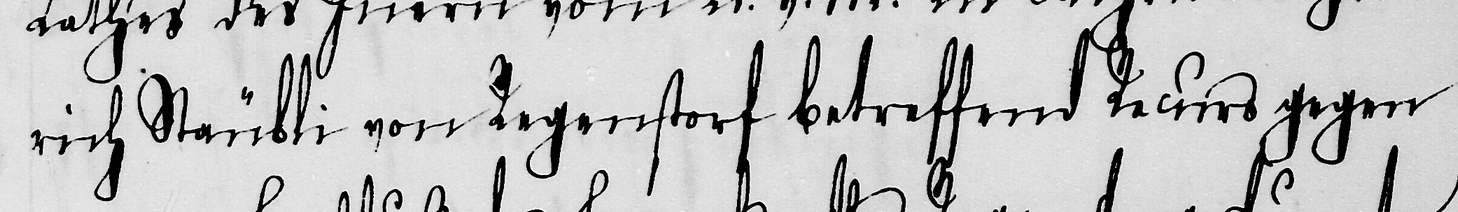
rich Stäubli von Regenstorf betreffend Recurs gegen
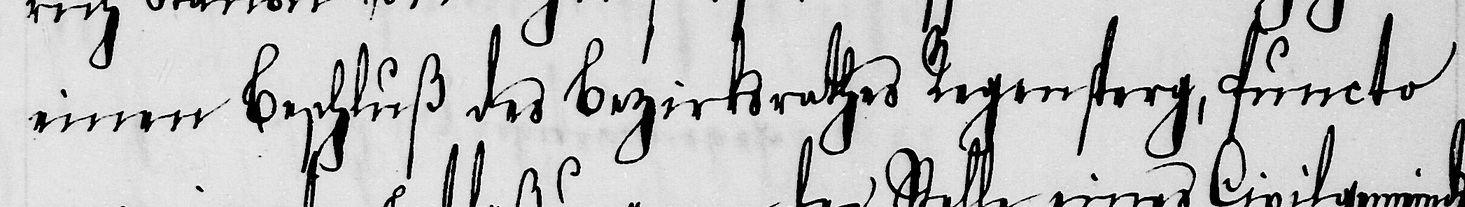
einen Beschluß des Bezirksrathes Regensberg, puncto
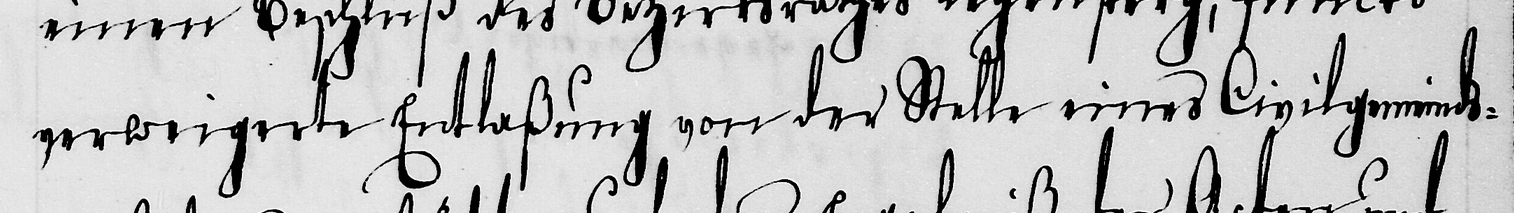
verweigerte Entlaßung von der Stelle eines Civilgemeinds¬
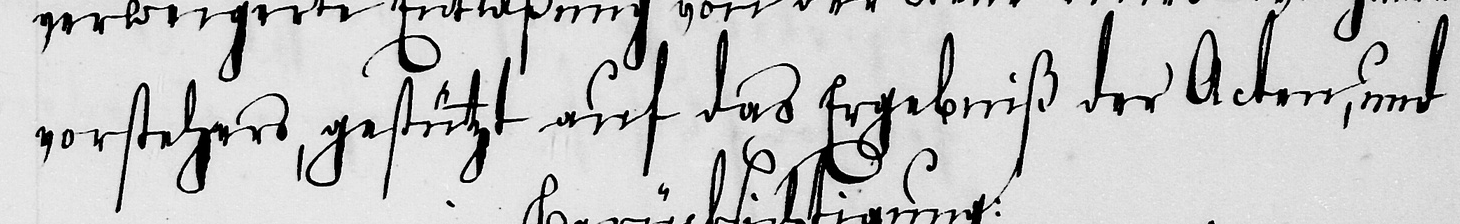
vorstehers, gestützt auf das Ergebniß der Acten, und
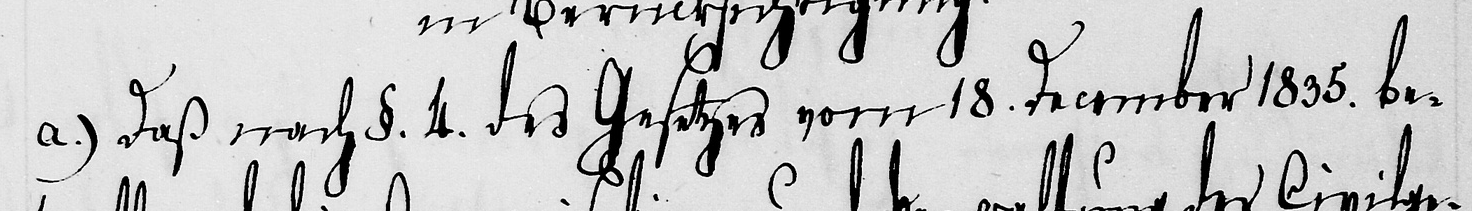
a.) Daß nach §. 4. des Gesetzes vom 18. December 1835. be¬
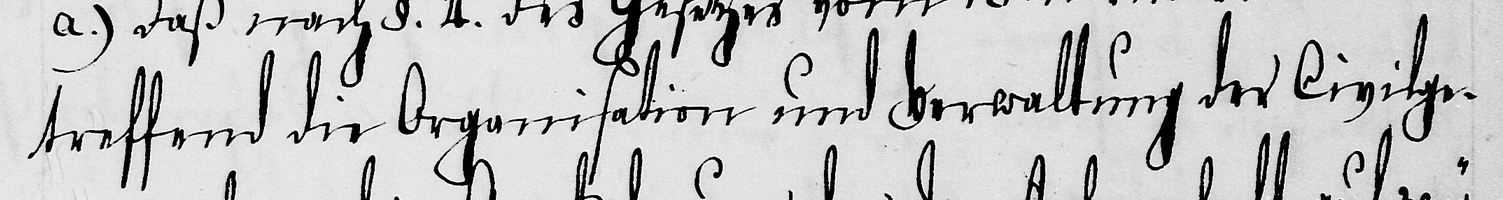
treffend die Organisation und Verwaltung der Civilge¬
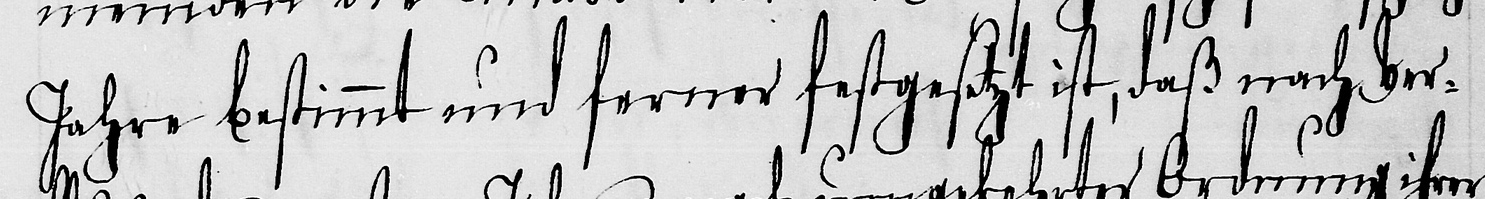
Jahre bestimmt und ferner festgesetzt ist, daß nach Ver¬
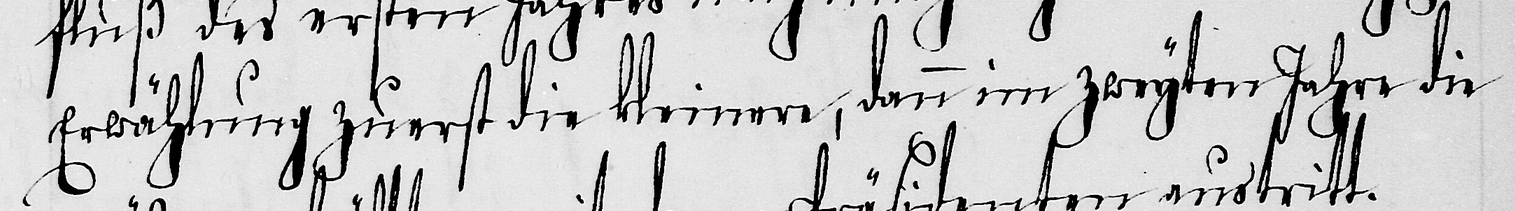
Erwählung zuerst die kleinere, dann im zweyten Jahre die
